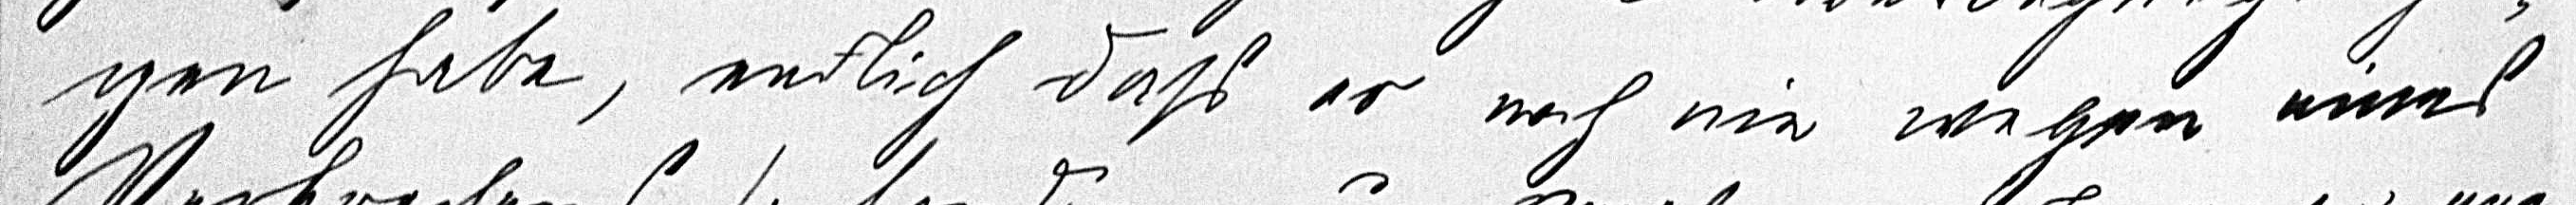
gen habe, endlich daß er noch nie wegen eines
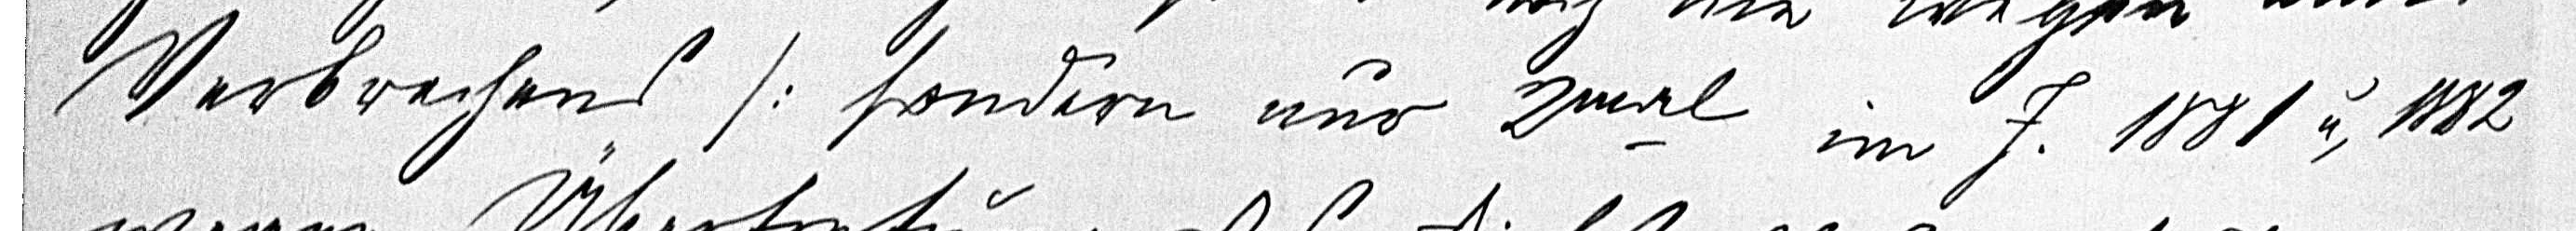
Verbrechens (sondern nur 2mal im J. 1881 u 1882
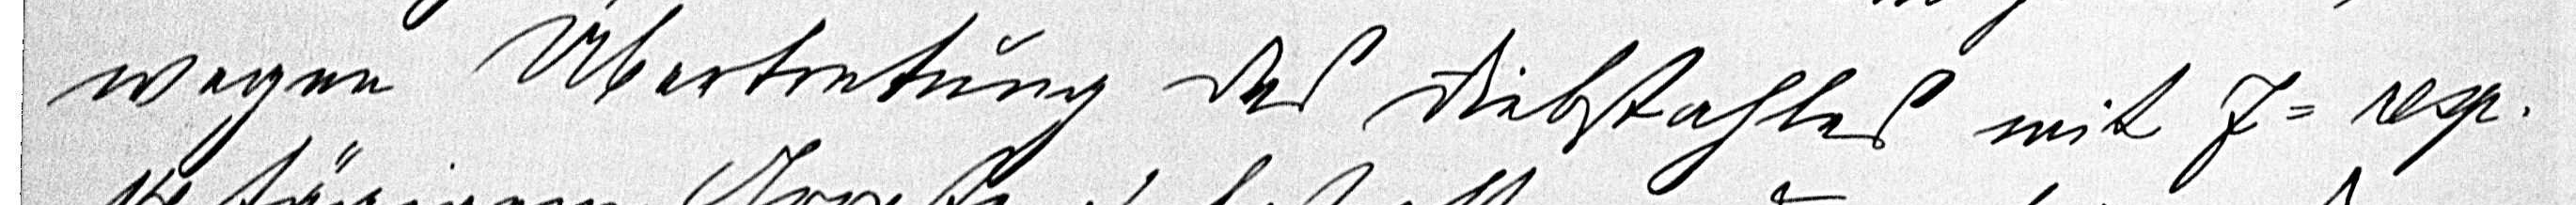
wegen Übertretung des Diebstahles mit 7 – resp.
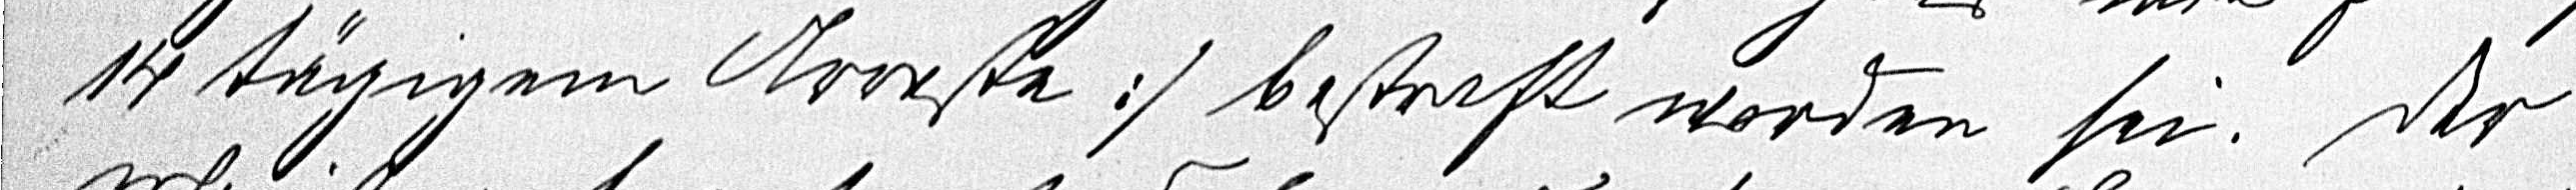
14 tägigem Arreste) bestraft worden sei. Der
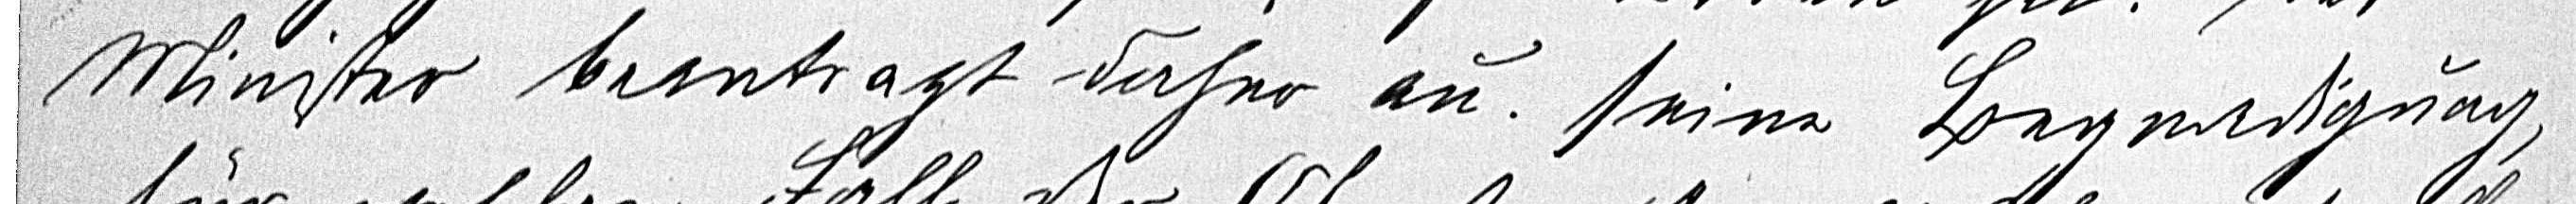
Minister beantragt daher au. Seine Begnadigung,
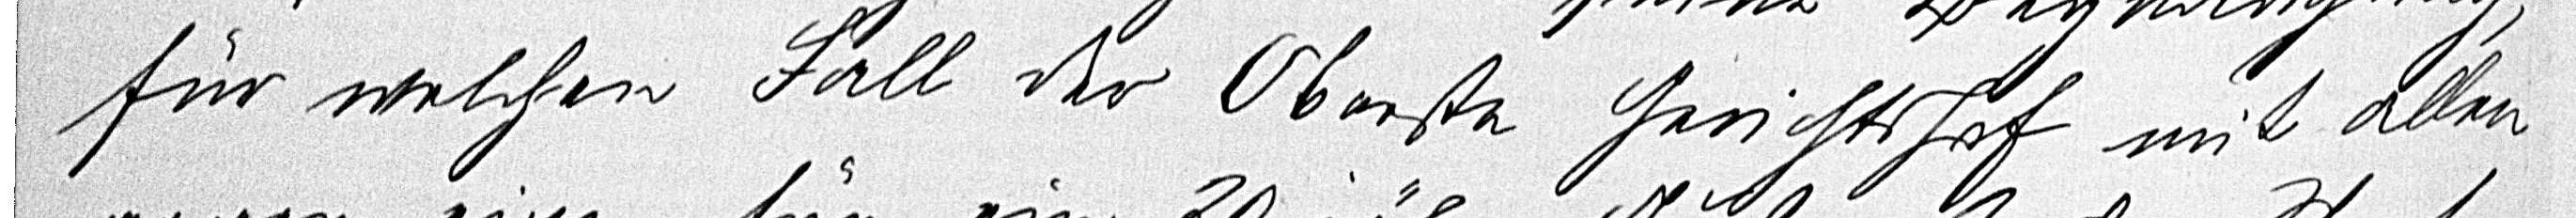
für welchen Fall der Oberste Gerichtshof mit allen
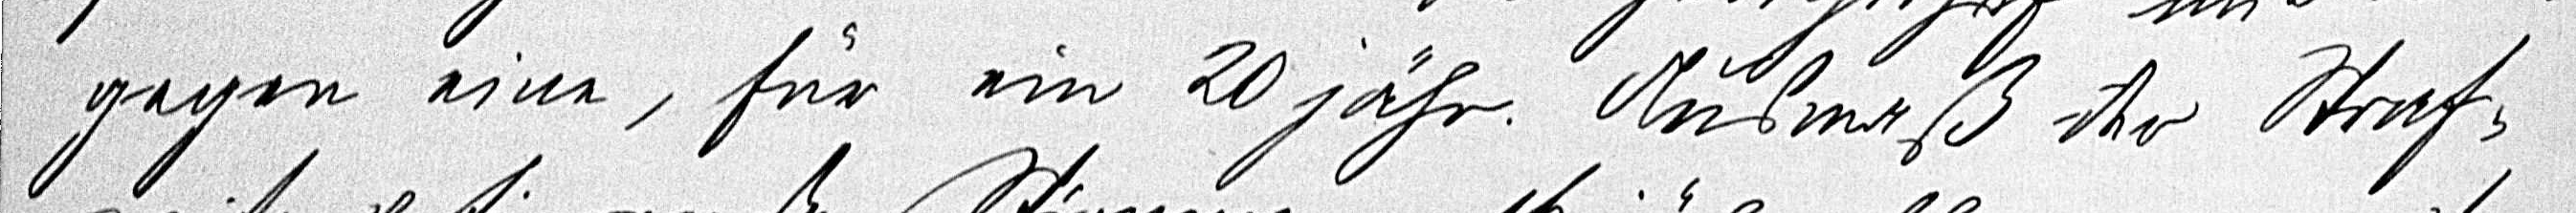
gegen eine, für ein 20 jähr. Ausmaß der Straf¬
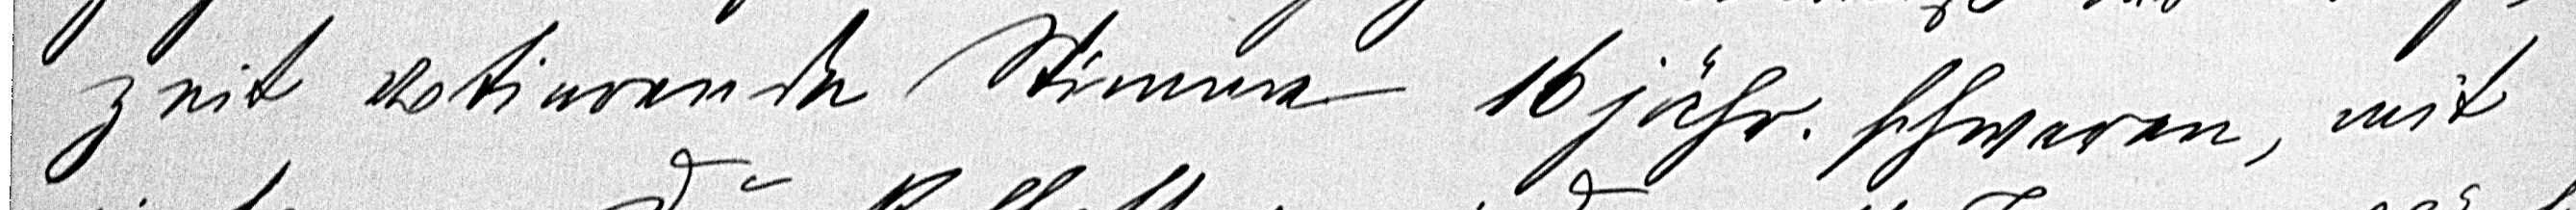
zeit votierende Stimme 16 jähr. Schweren, mit
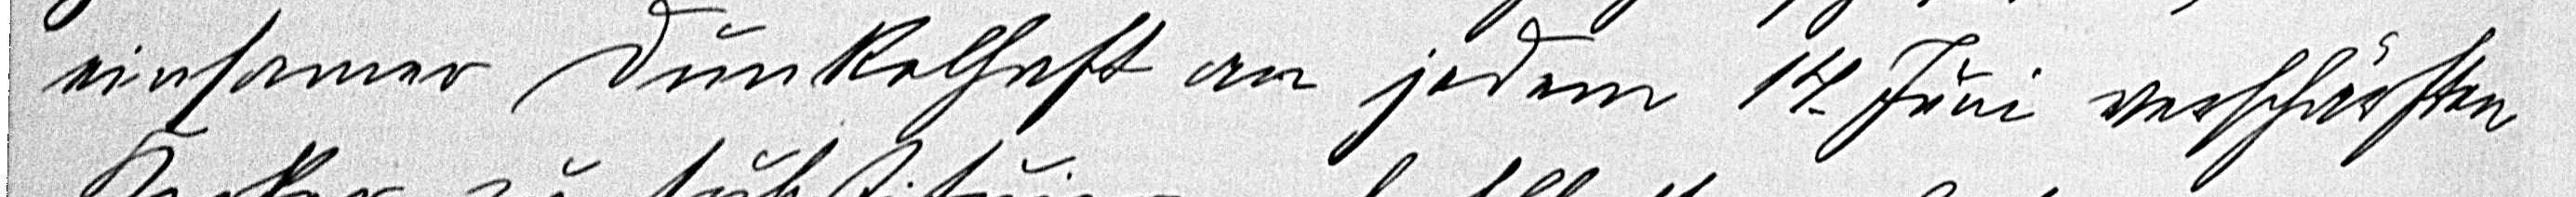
einsamer Dunkelhaft an jedem 14 Juni verschärften
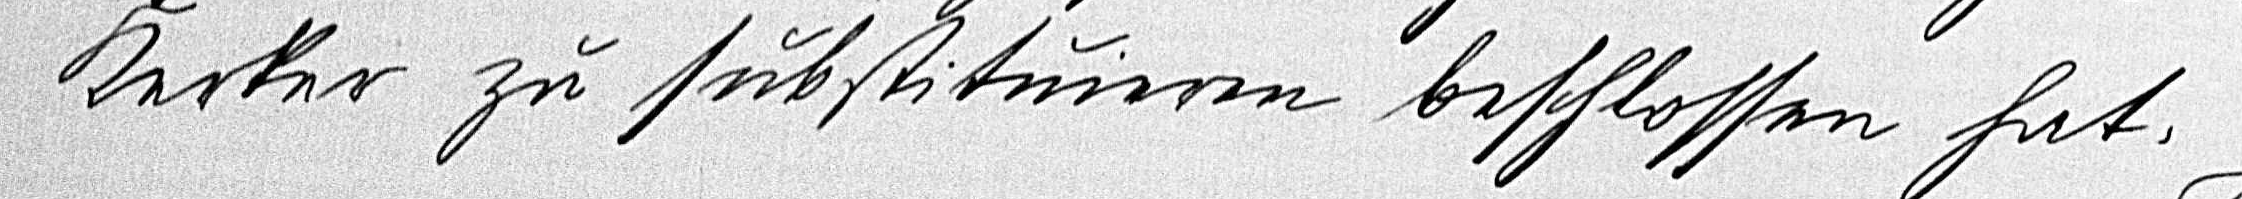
Kerker zu substituieren beschlossen hat.
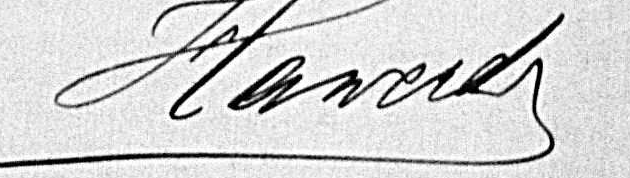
Haweck
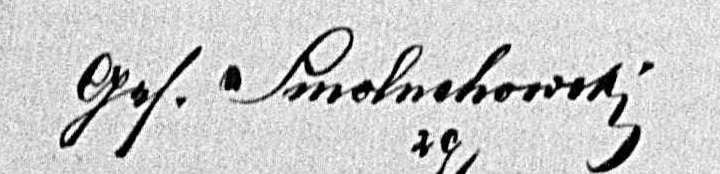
Ges. Smolnchowski
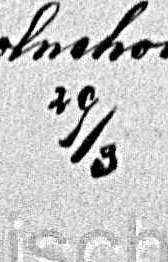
29/3
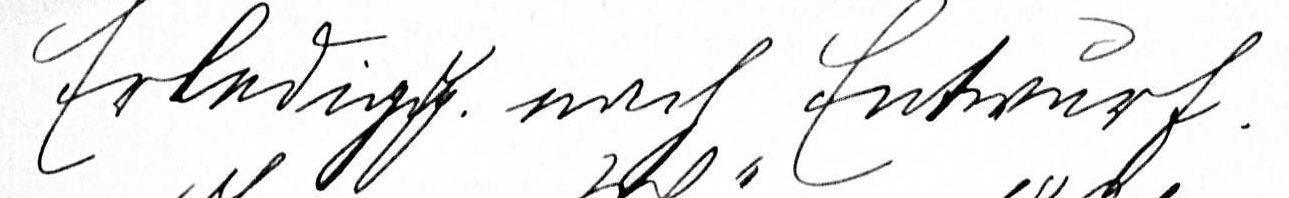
Erledigung nach Entwurf
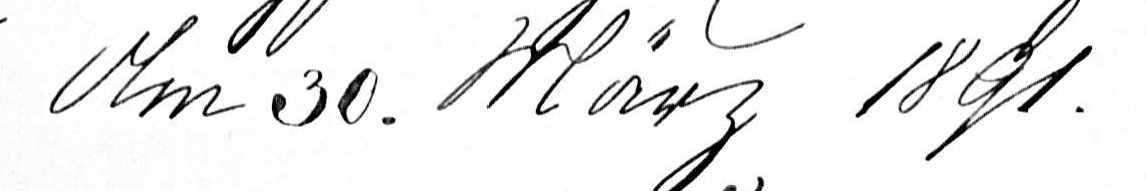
Am 30. März 1891
